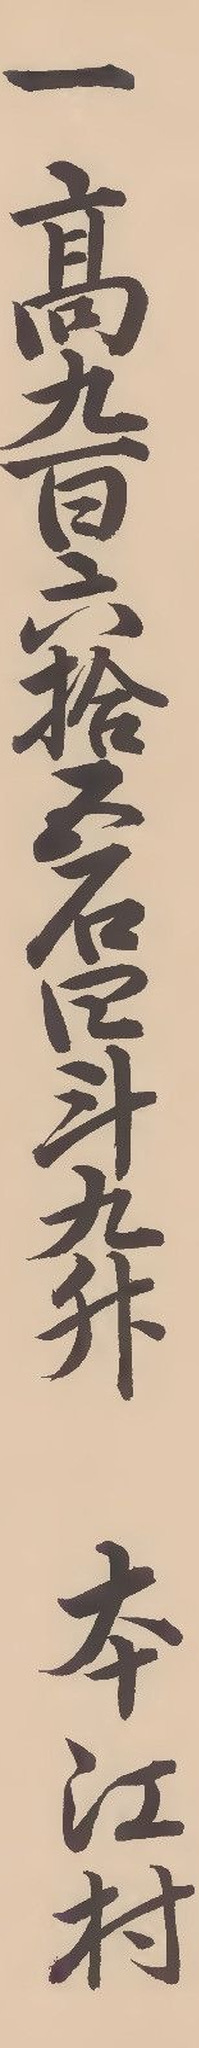一高九百六拾五石四斗九升本江村
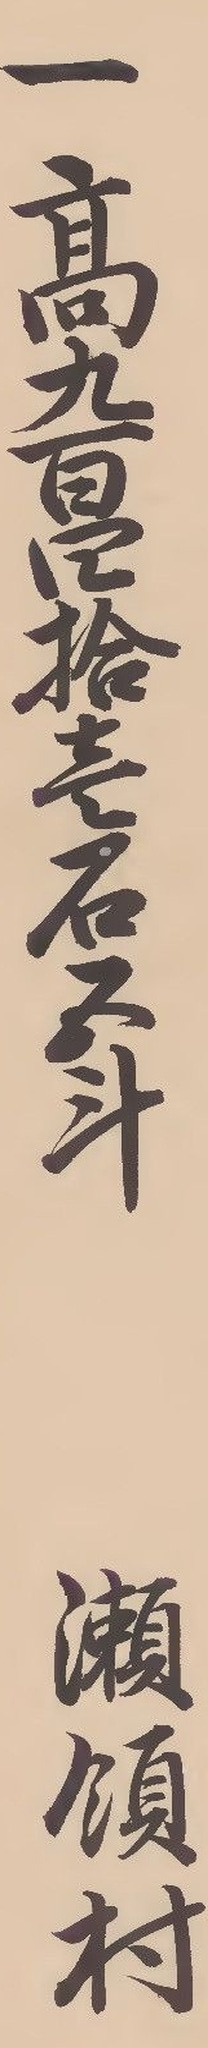一高九百四拾壱石五斗瀬領村

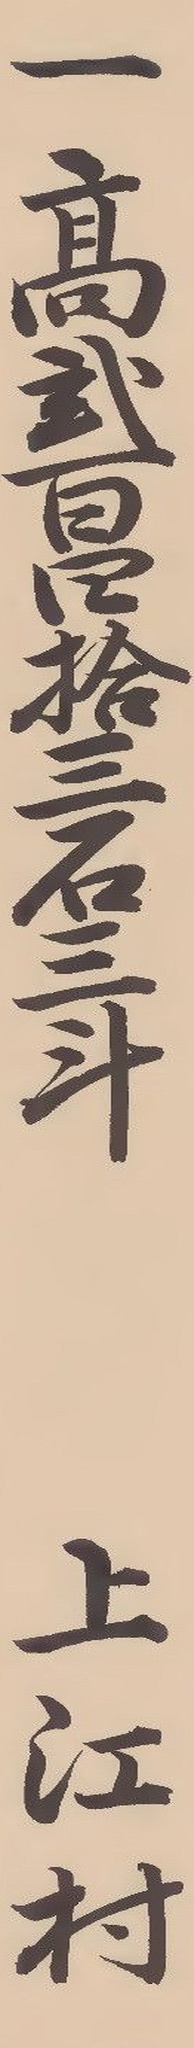一高弐百四拾三石三斗上江村
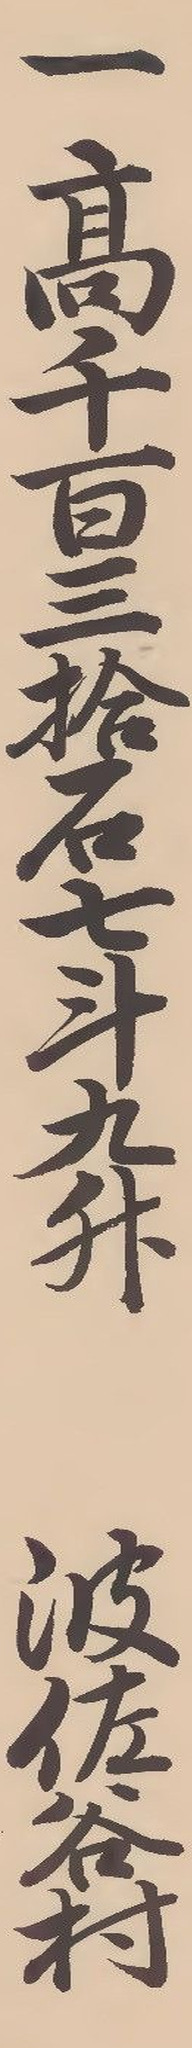一高千百三拾石七斗九升波佐谷村
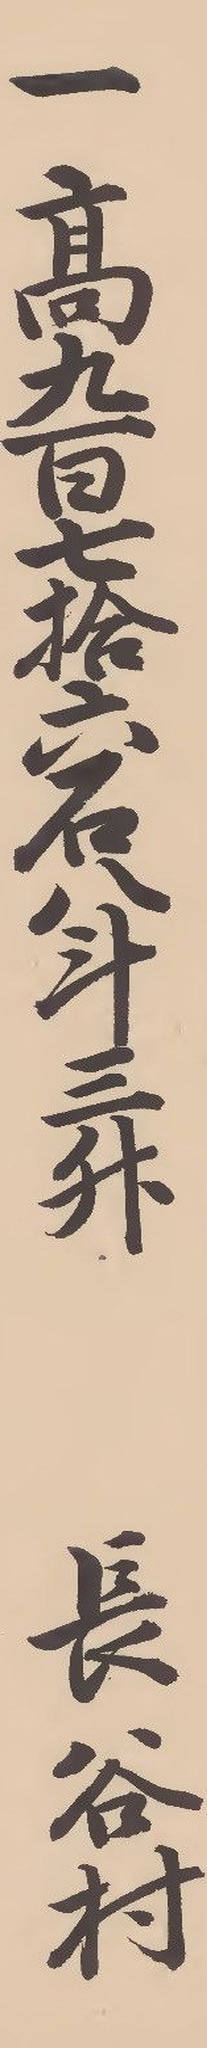一高九百七拾六石八斗三升長谷村
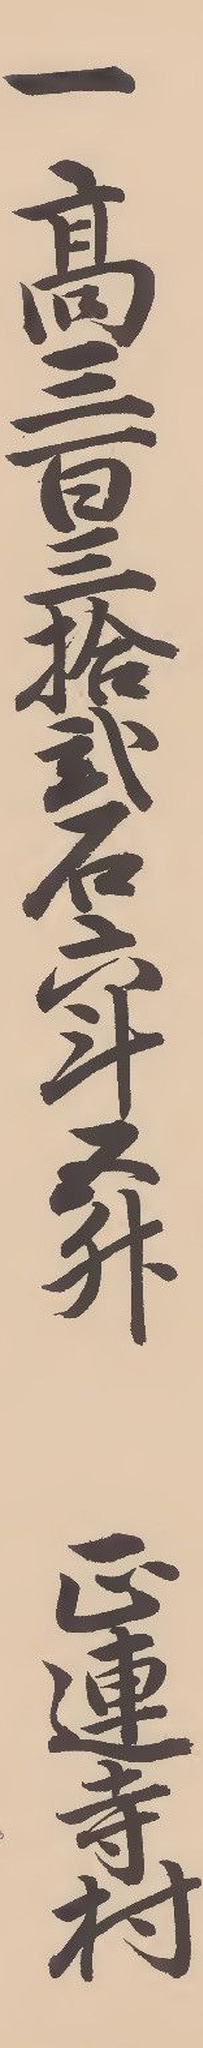一高三百三拾弐石六斗五升正連寺村
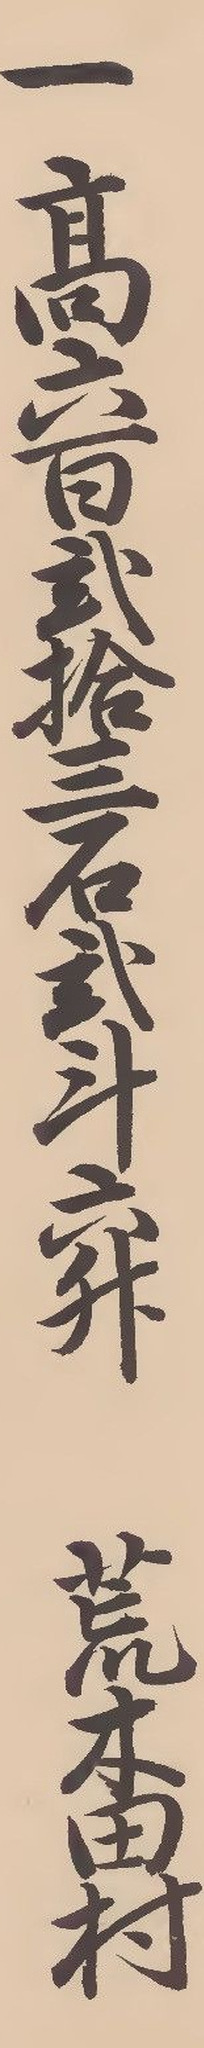一高六百弐拾三石弐斗六升荒木田村
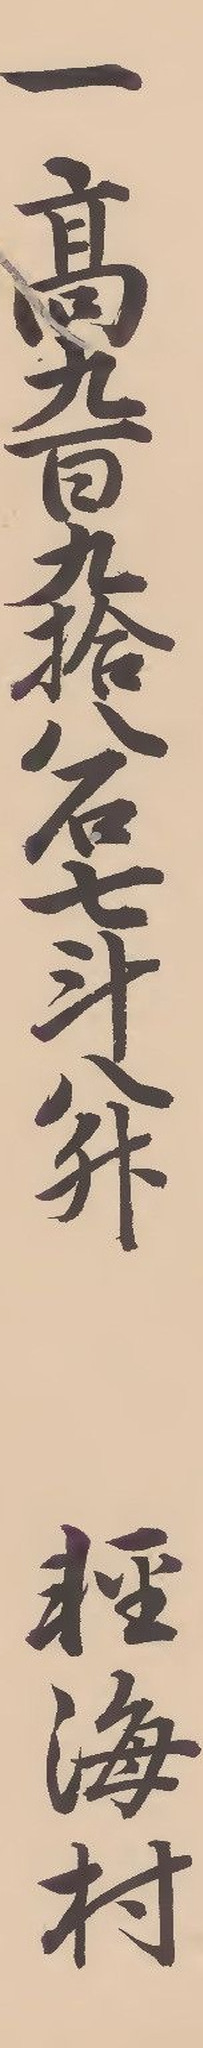一高九百九拾八石七斗八升軽海村

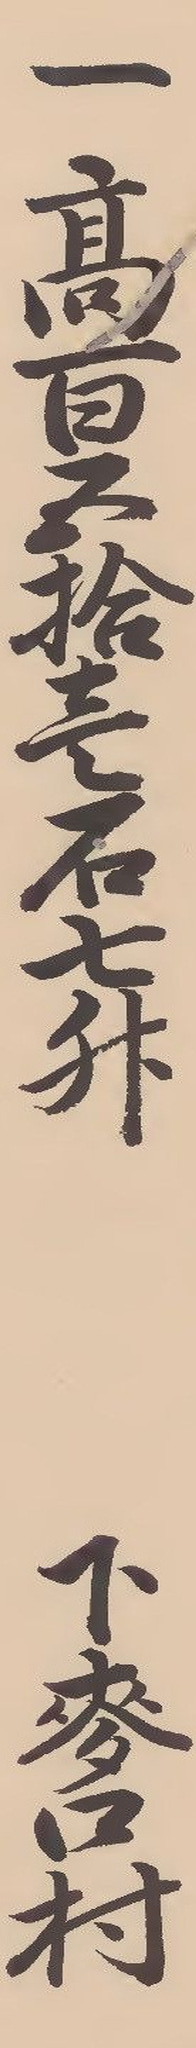一高百五拾壱石七升下麦口村
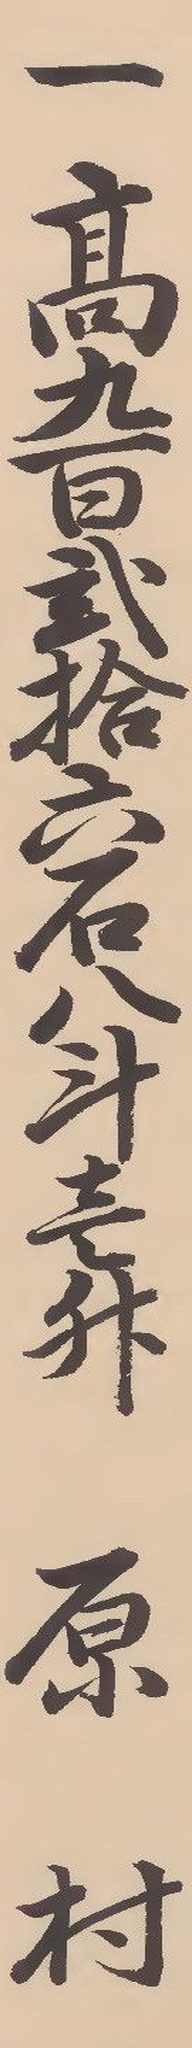一高九百弐拾六石八斗壱升原村
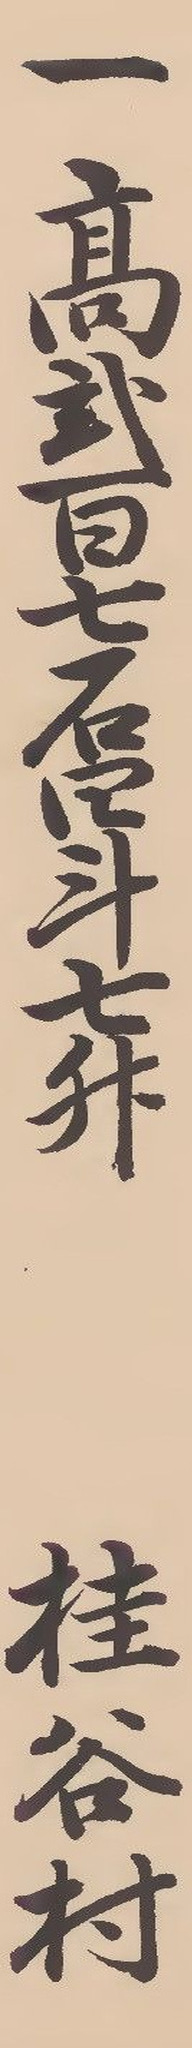一高弐百七石四斗七升桂谷村
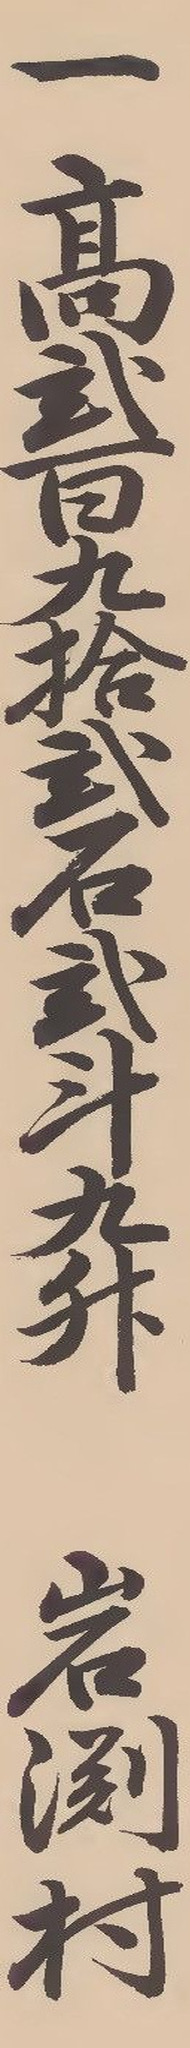一高弐百九拾弐石弐斗九升岩淵村
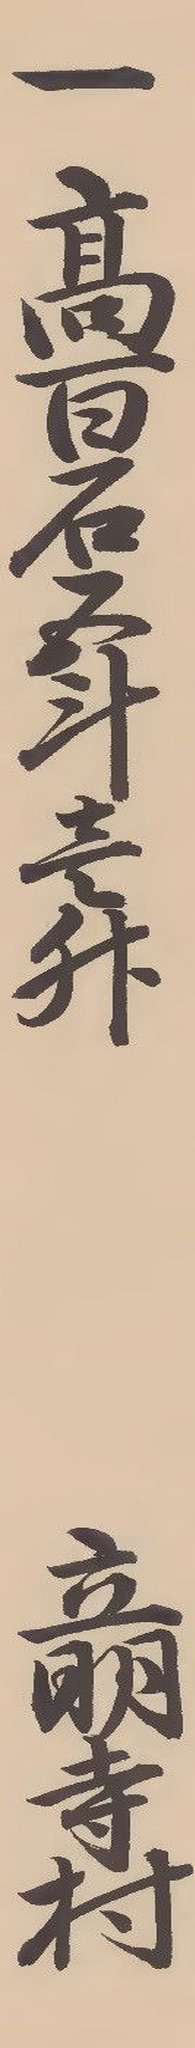一高百石五斗壱升立明寺村

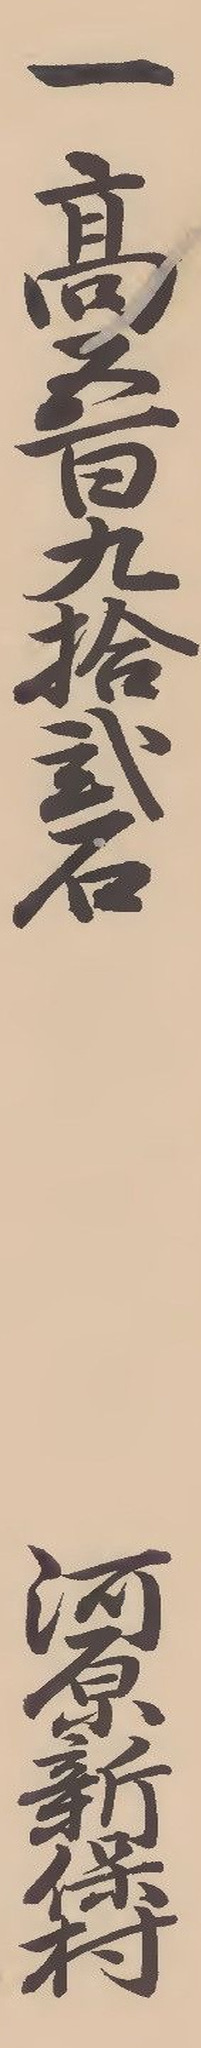一高五百九拾弐石河原新保村
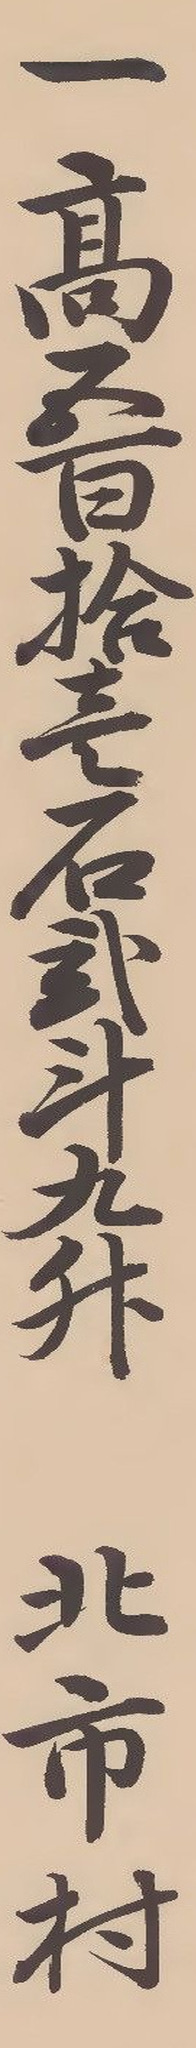一高五百拾壱石弐斗九升北市村
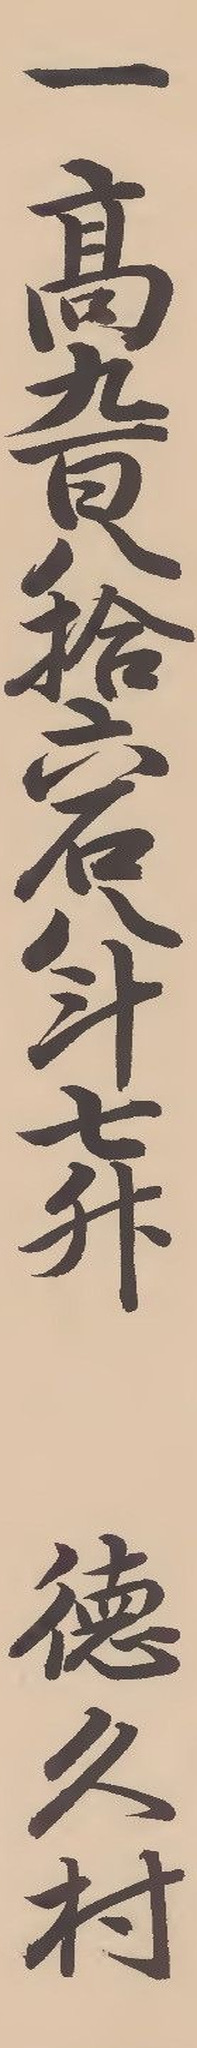一高九百八拾六石八斗七升徳久村
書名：加賀国郷帳
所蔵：国立公文書館 National Archives of Japan
